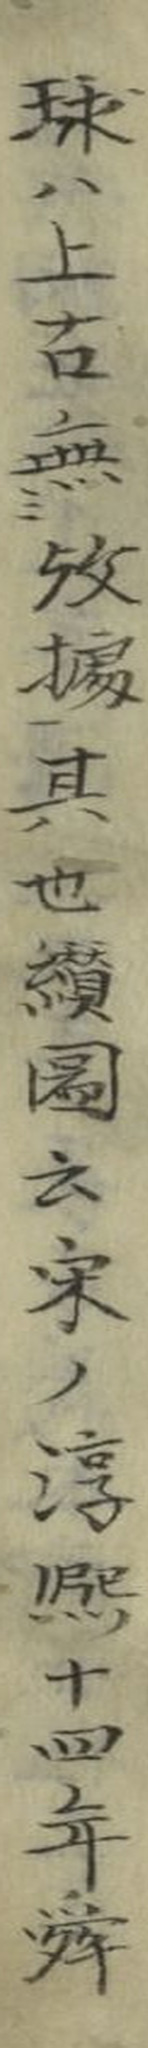球は上古無攷拠其世纉図云宋の淳凞十四年舜
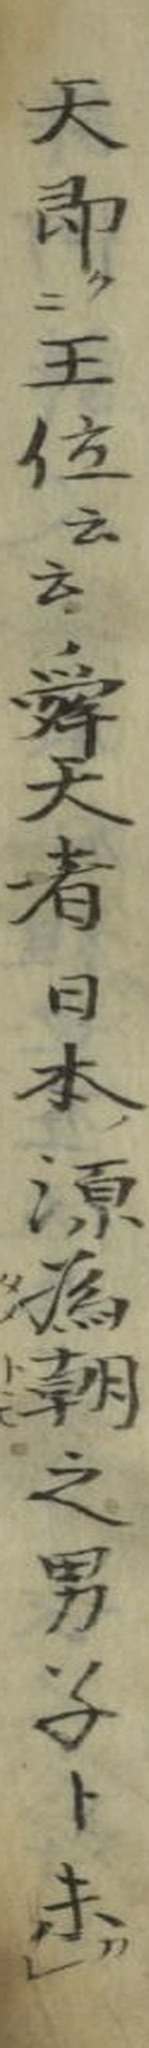天即くに王位云々舜天は日本の源為朝の男子と未

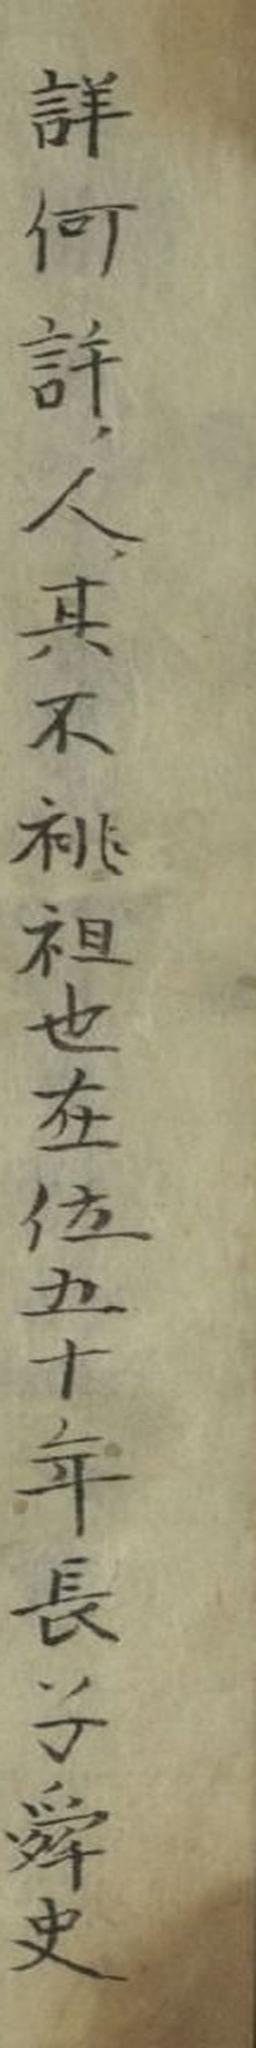詳何許の人其不祧祖也在位五十年長子舜史
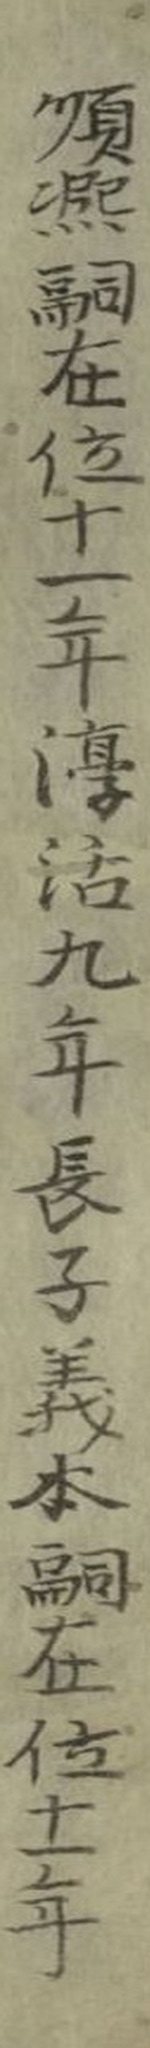順凞嗣在位十一年活九年長子義本嗣在位十一年
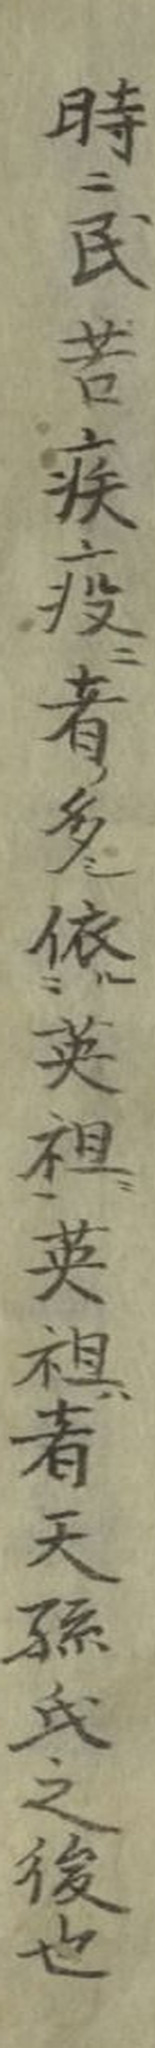時に民苦疾疫に者の多し依る英祖に英祖は者天孫氏之後也
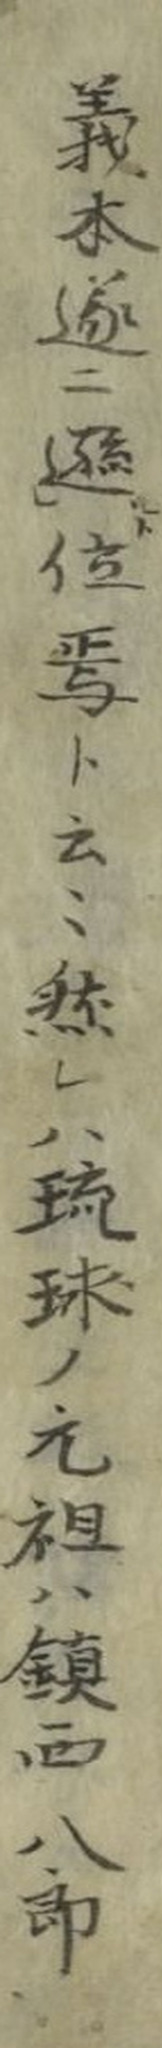義本遂に遜ると位焉と云々然る然れは琉球の元祖は鎮西八郎
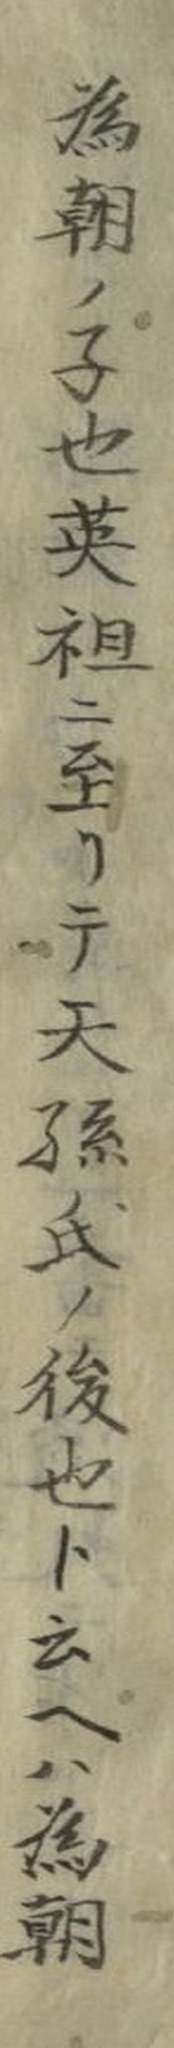為朝の子也英祖に至りて天孫氏の後也と云えは為朝
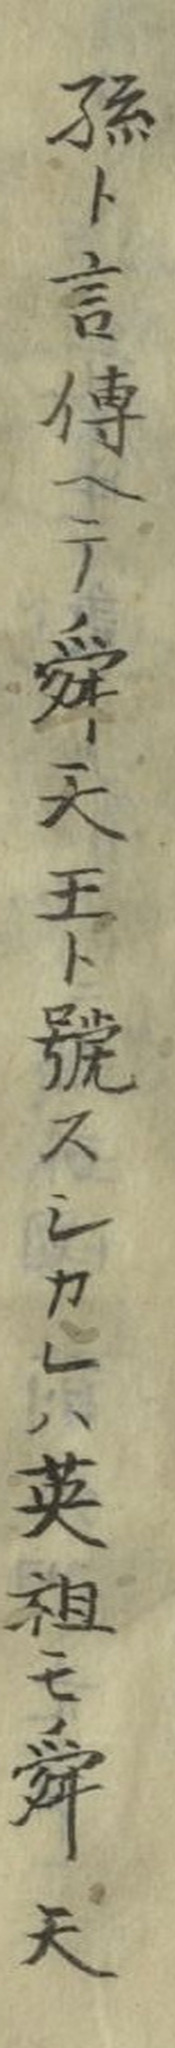孫と言伝へて舜天王と号すしかれは英祖も舜天
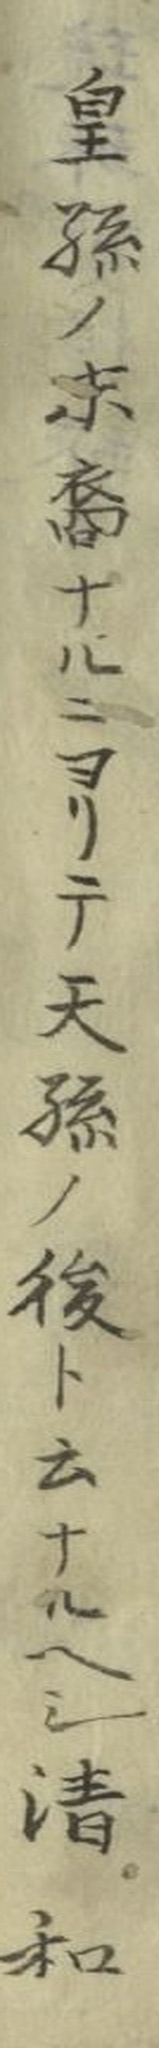皇孫の末裔なるによりて天孫の後と云なるへし清和
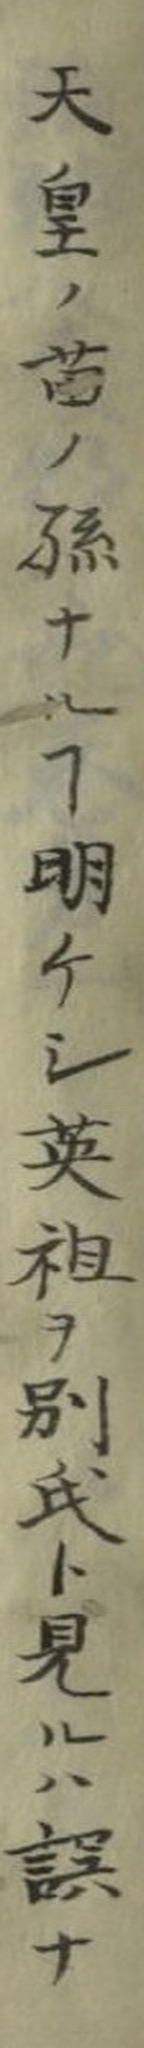天皇の苗の孫なること明けし英祖を別氏と見るは誤な

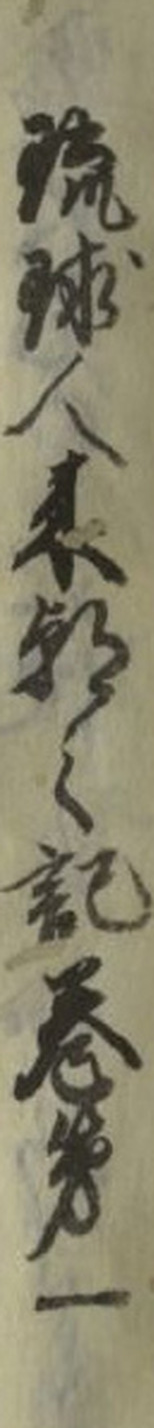琉球人来朝之記巻第一
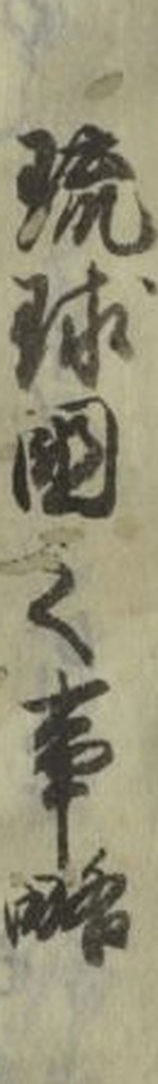琉球国之事略
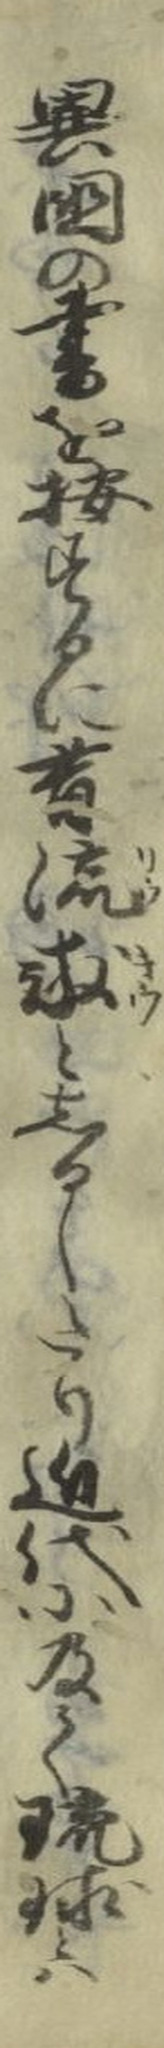異国の書を按するに昔流求としるしたり近代に及て琉球とは
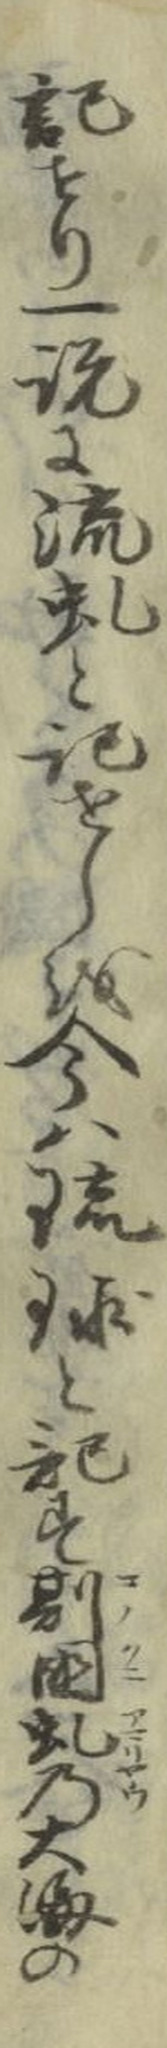記をり一説に流虬と記せしを今は琉球と記す斯国虬たい大海の
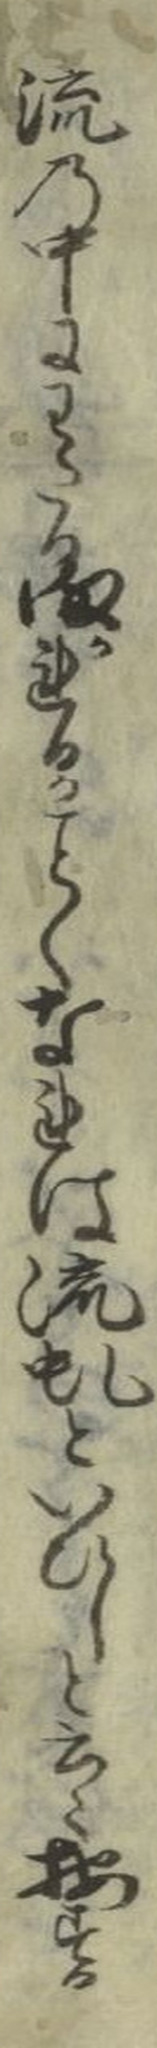流の中にわたりくれるかことくなれは琉虬といひしと云々按する
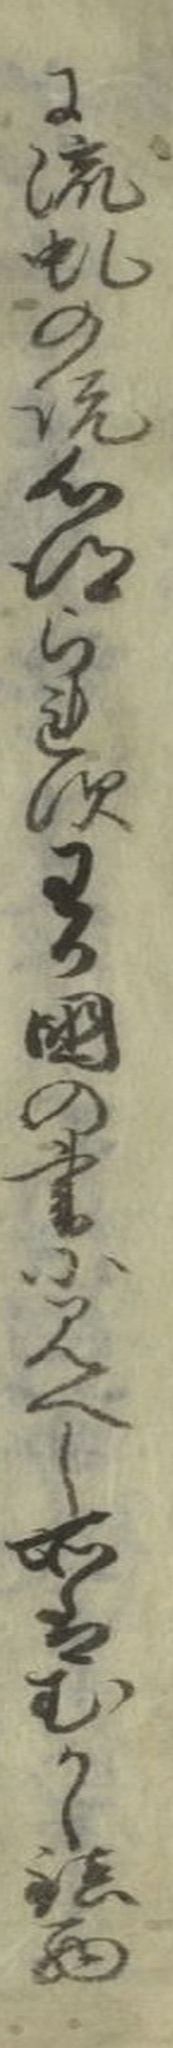に流虬の説心得られ次にわか国の書に見へし所はむかし鎮西
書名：琉球人来朝之記
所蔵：University of the Ryukyus Library
